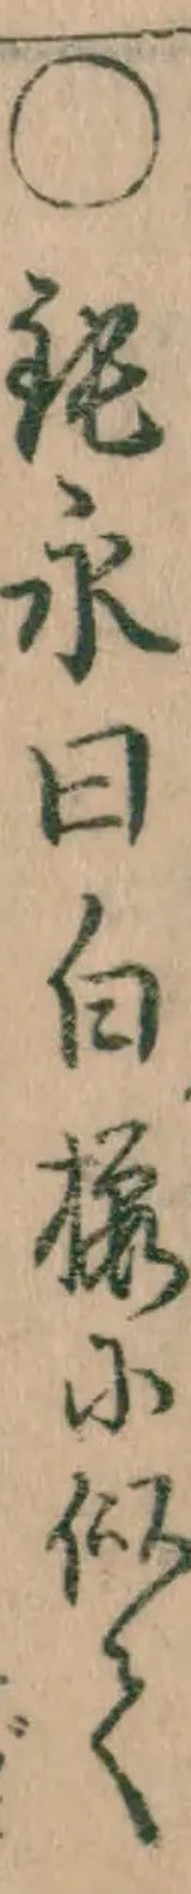○鈍永曰白桜に似て
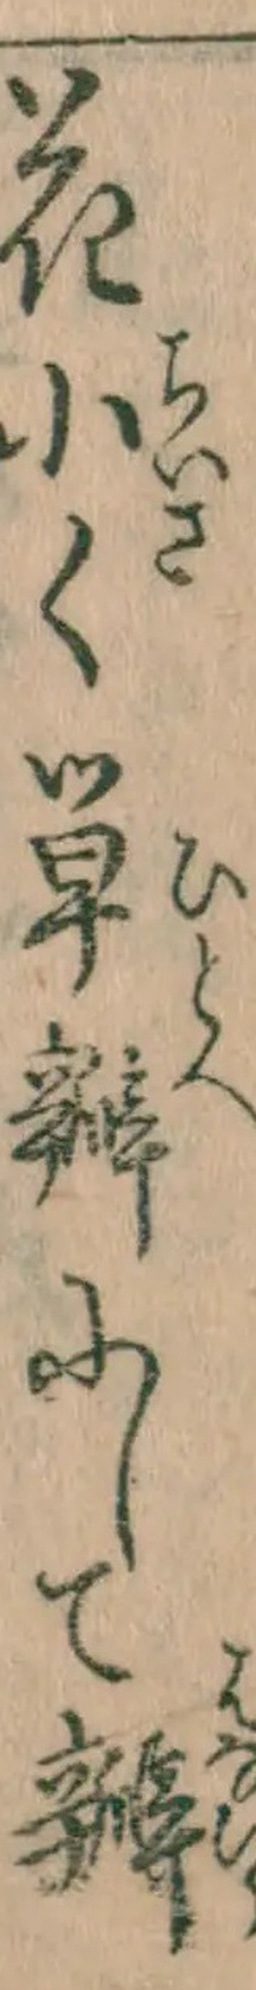花小く単弁にして弁
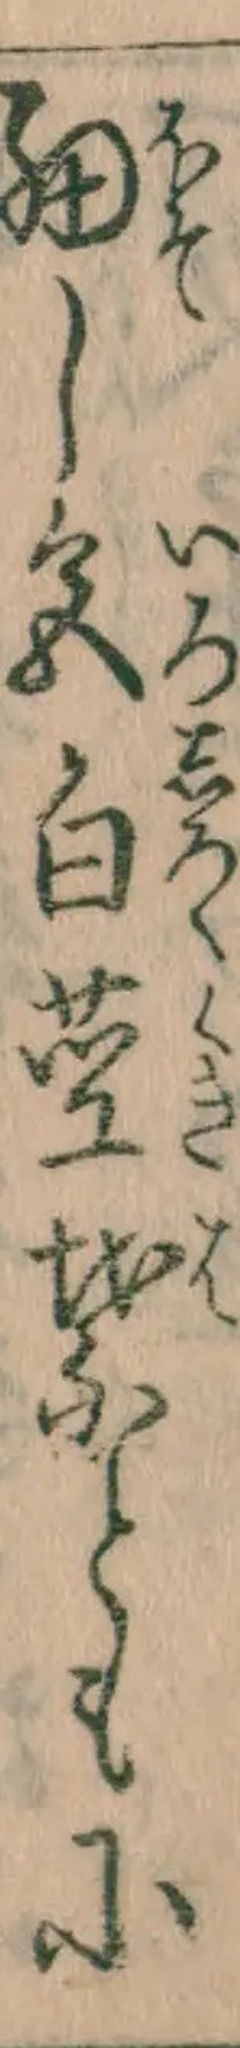細し色白茎葉ともに
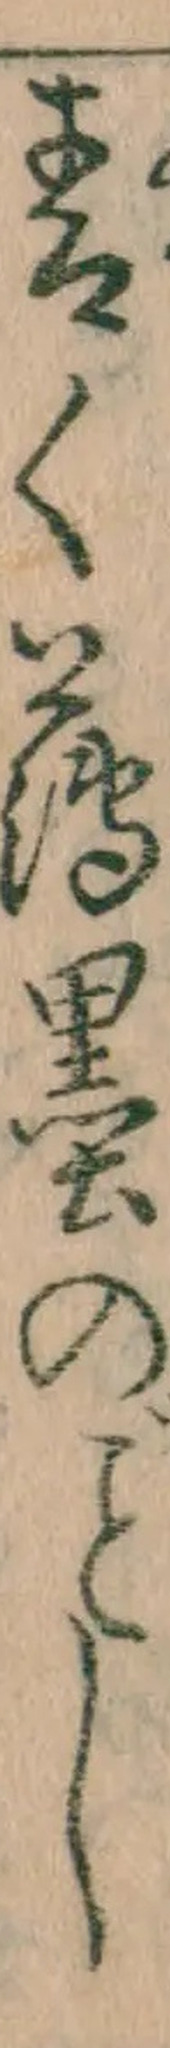青く薄墨のごとし
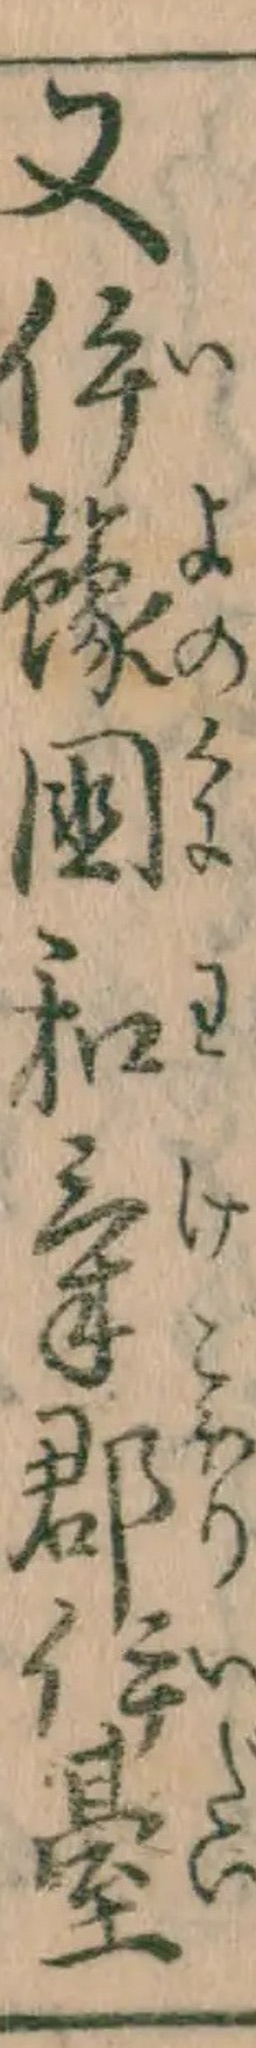又伊予国和気郡伊台
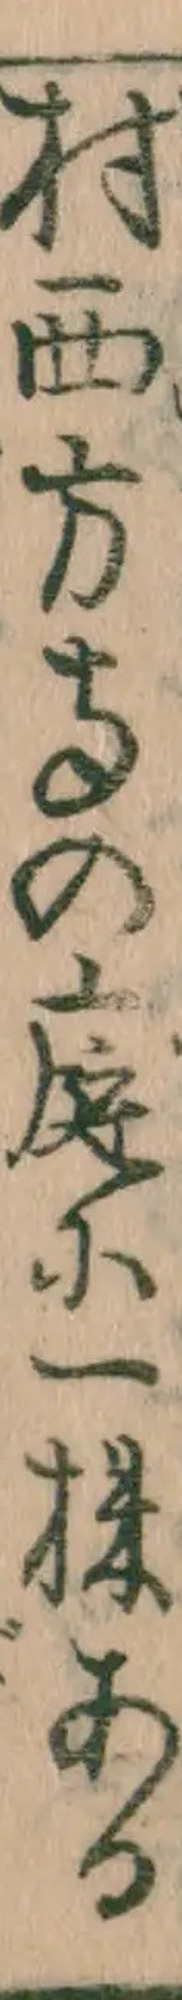村西方寺の庭に一株ある
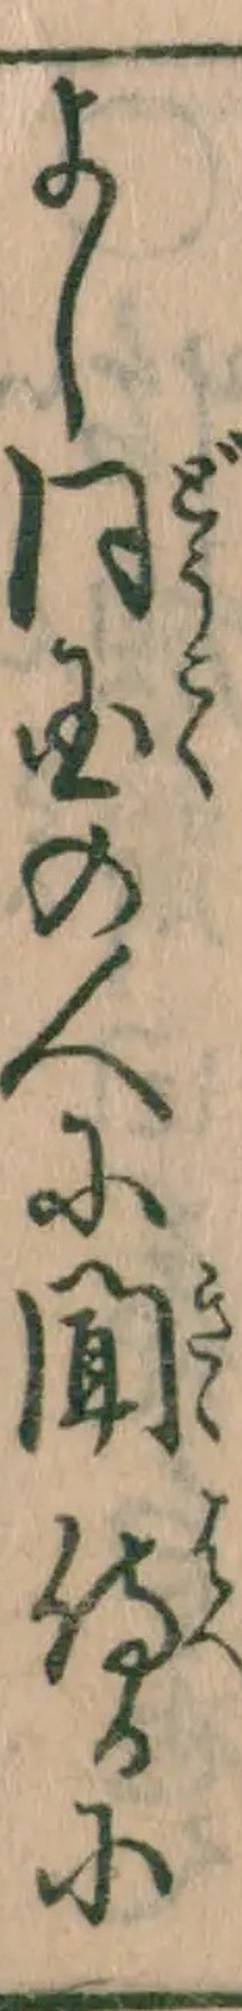よし同国の人に聞侍るに
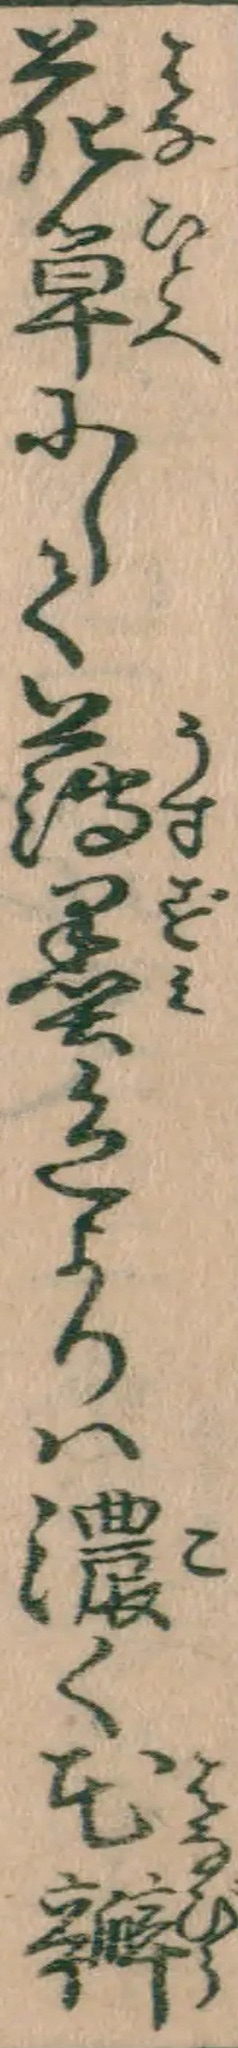花単にして薄墨色よりは濃く花弁
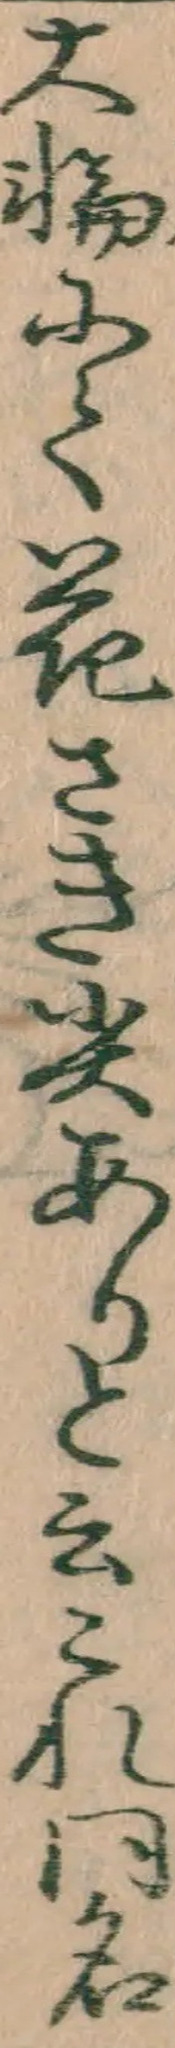大輪にて花さき尖ありと云これ同名
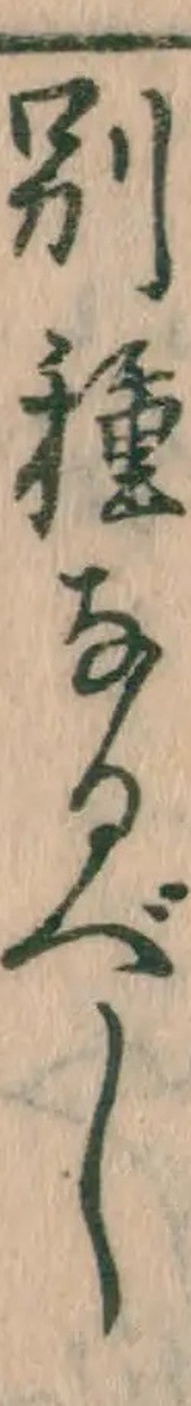別種なるべし

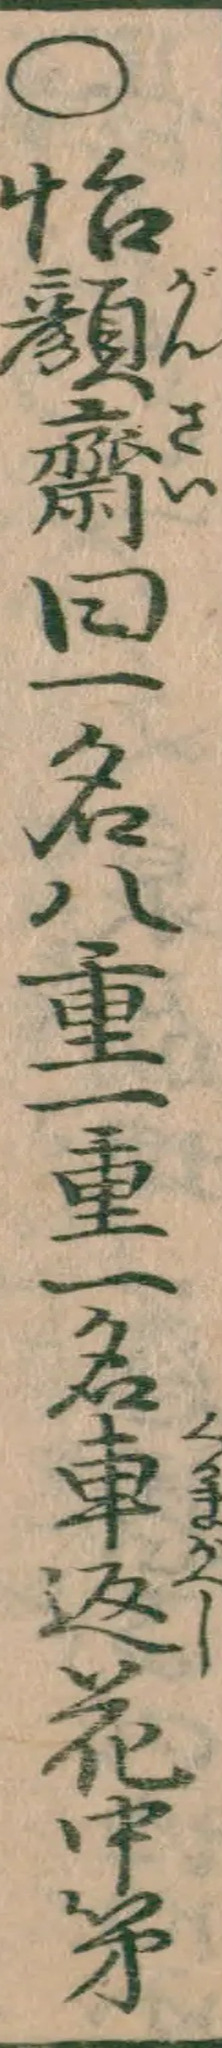○怡顔斎曰一名八重一重一名車返花中第
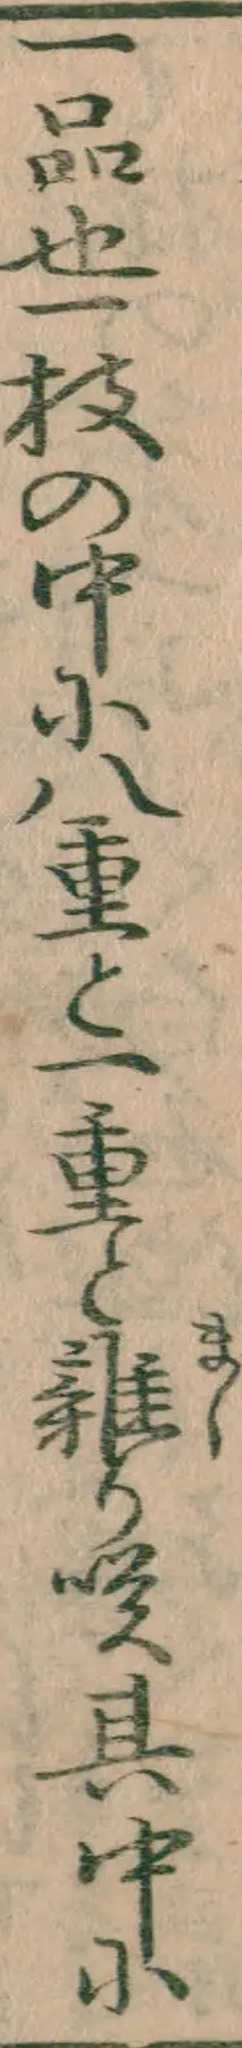一品也一枝の中に八重と一重と雑り咲其中に
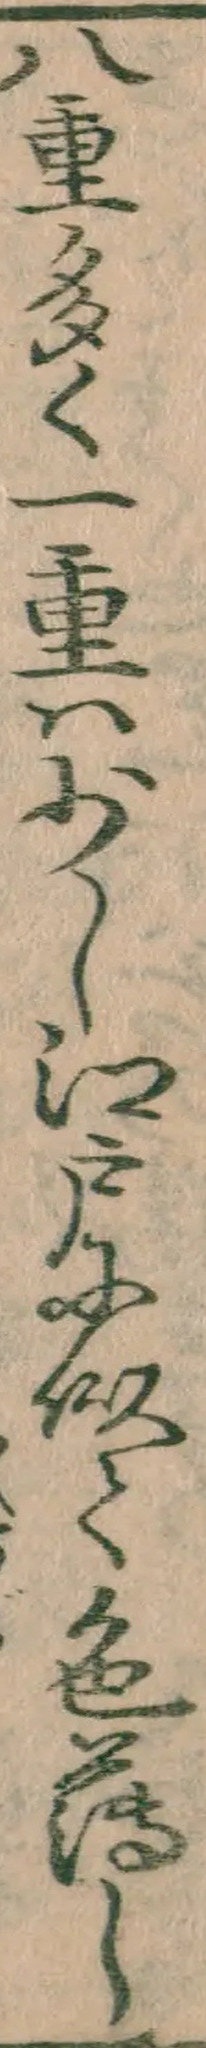八重多く一重は少し江戸に似て色薄し
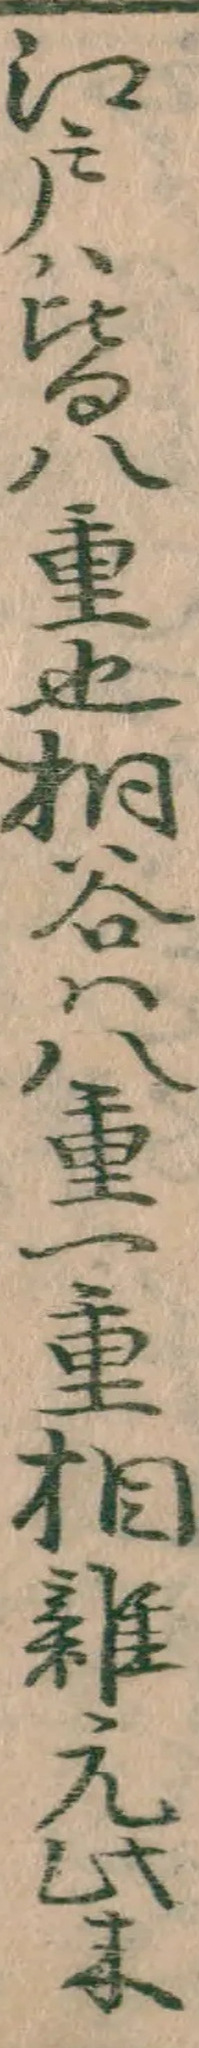江戸は皆八重也桐谷は八重一重相雑元此木
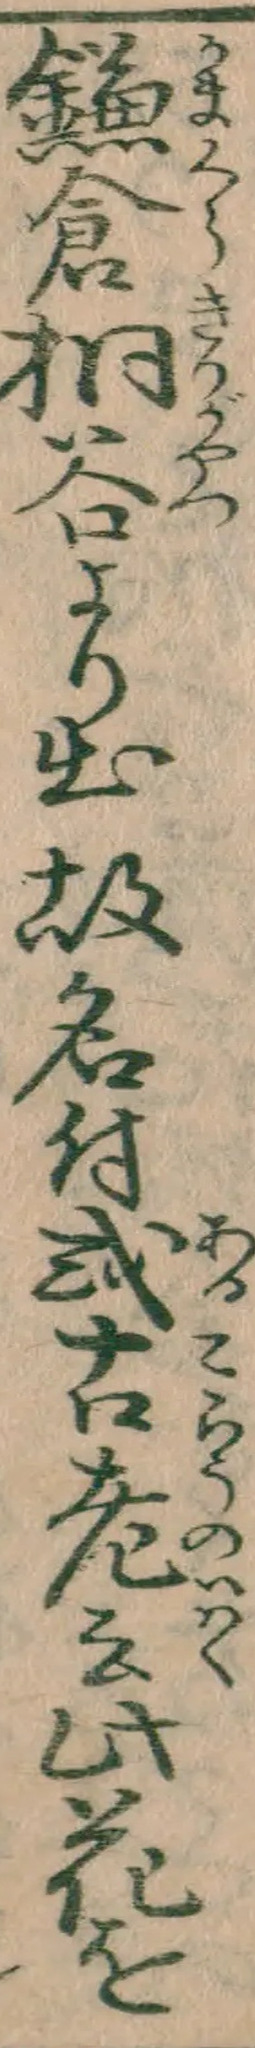鎌倉桐谷より出故名付或古老云此花を
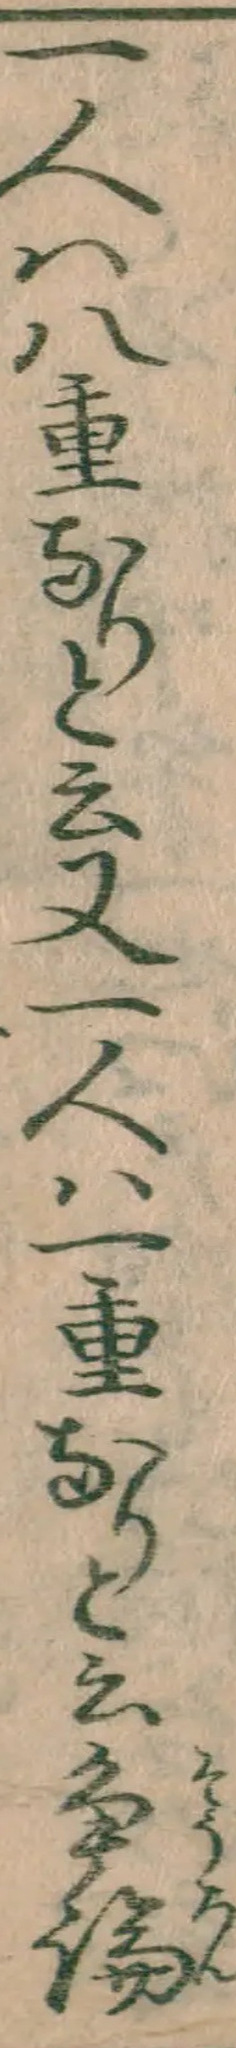一人は八重なりと云又一人は一重なりと云争論
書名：怡顔齋櫻品
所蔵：国立国会図書館 National Diet Library, JAPAN
